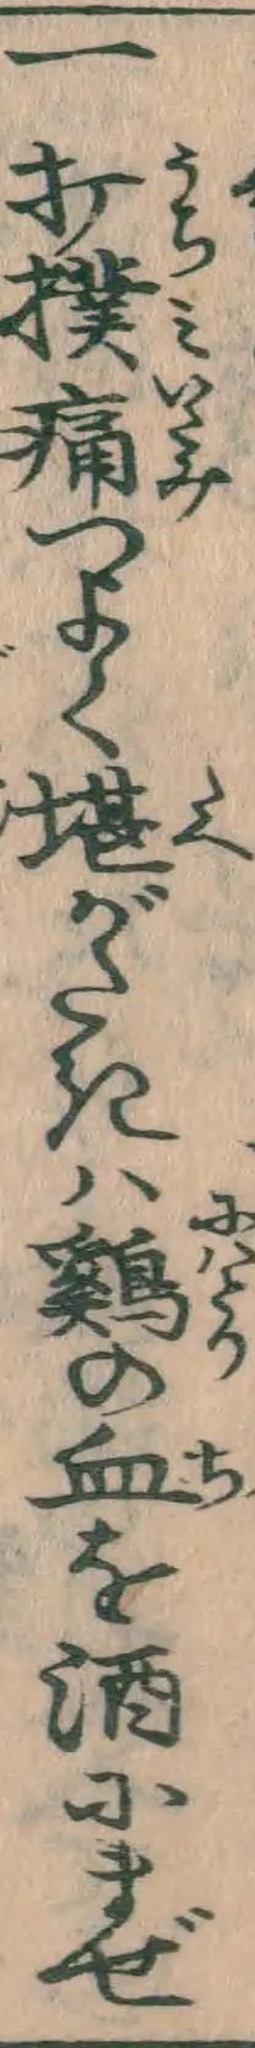一打撲痛つよく堪がたきは鶏の血を酒にまぜ
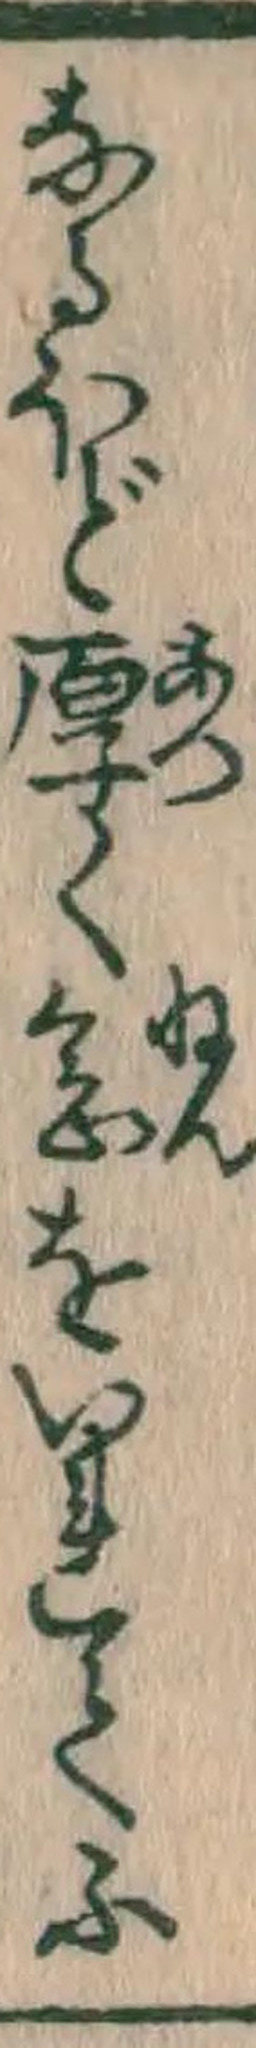なるほど厚く念をいれてふ
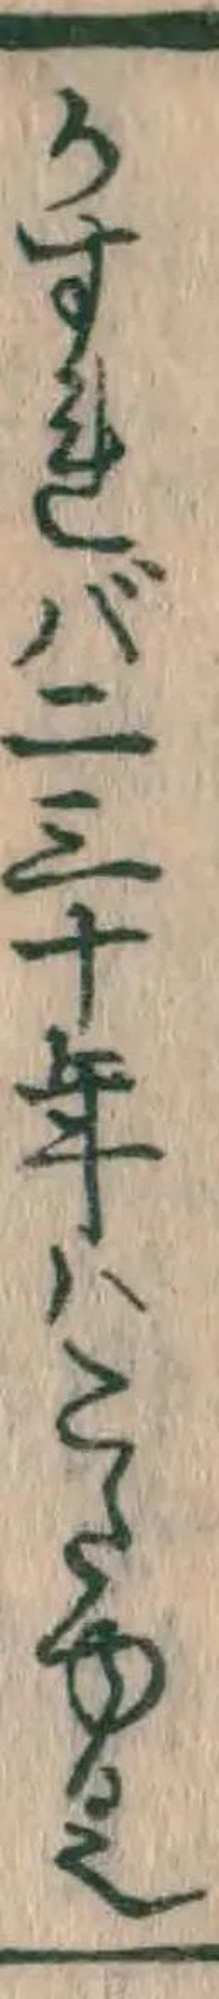かすれば二三十年はこたゆる也
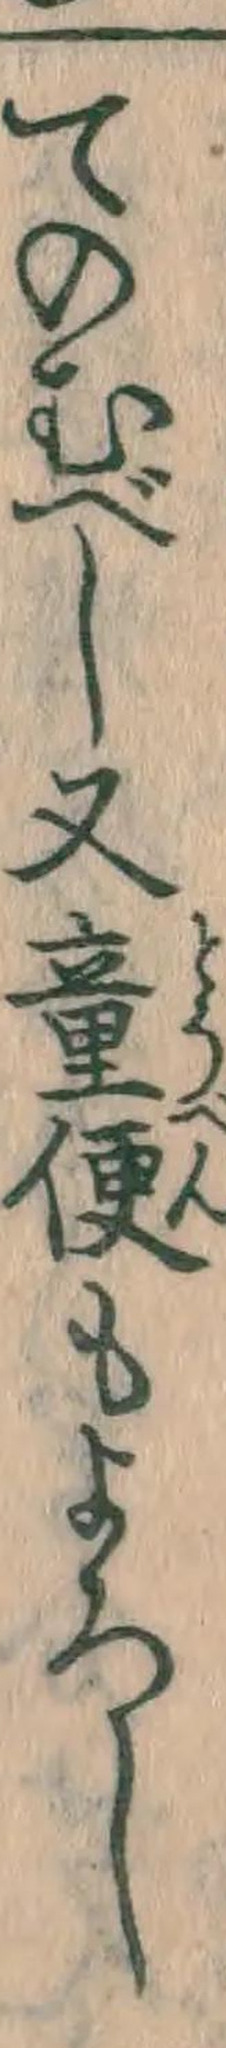てのむべしま又童便もよろし
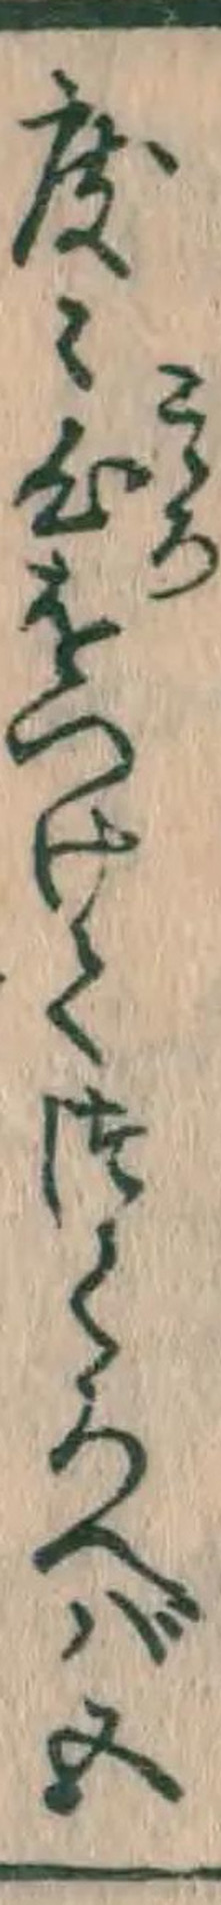度々心をつけてつくろへば五
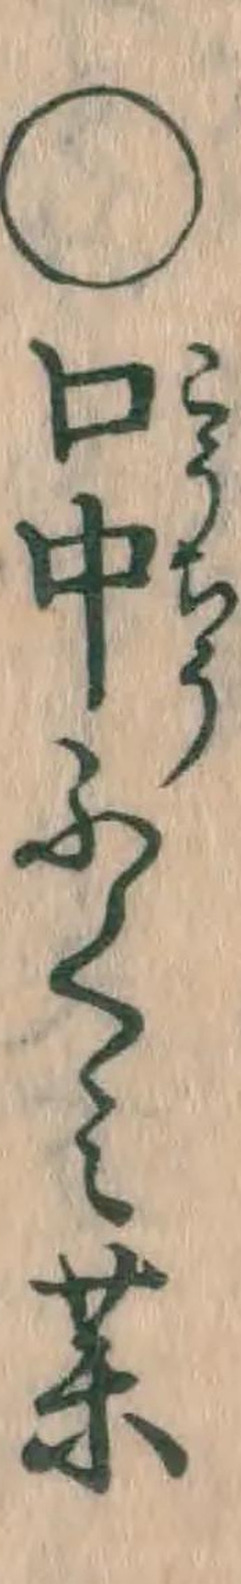○口中ふくみ薬
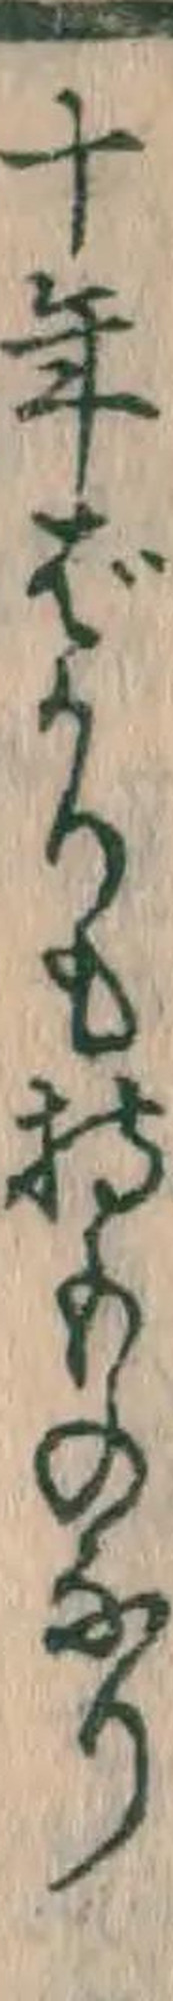十年ばかりも持ものなり
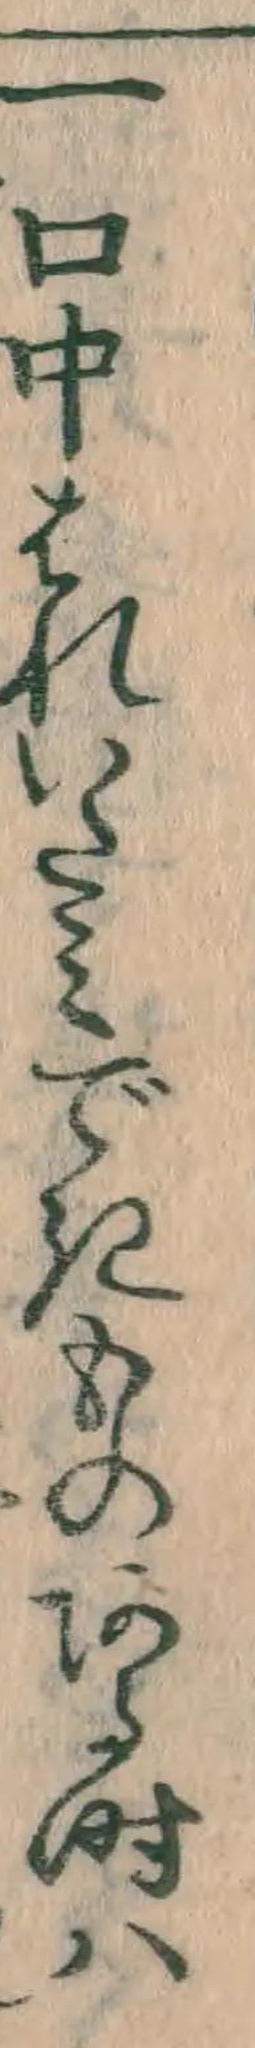一口中はれいたみできものある時は
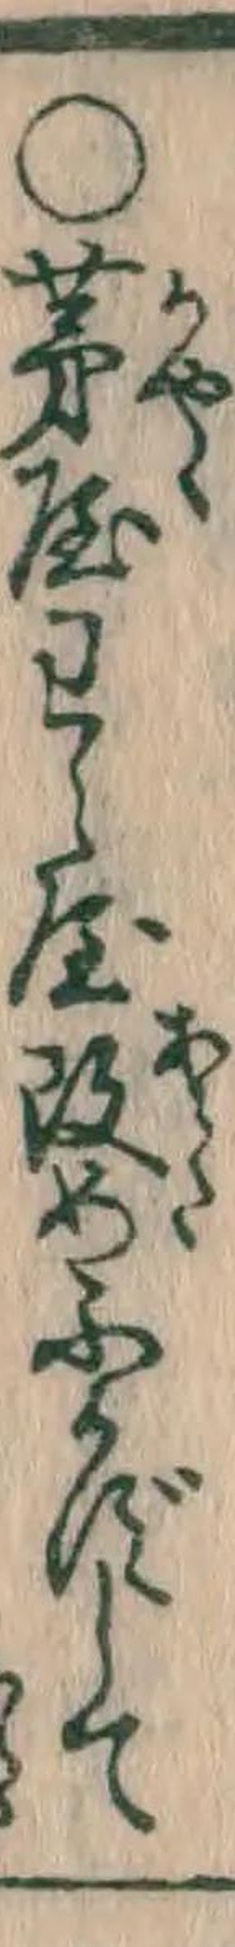○茅屋わら屋改めふかずして
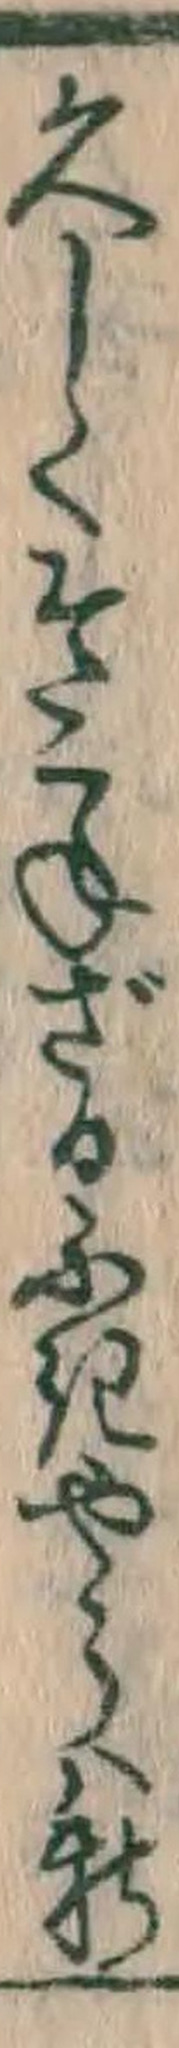久しくそこねざるふきやうは新
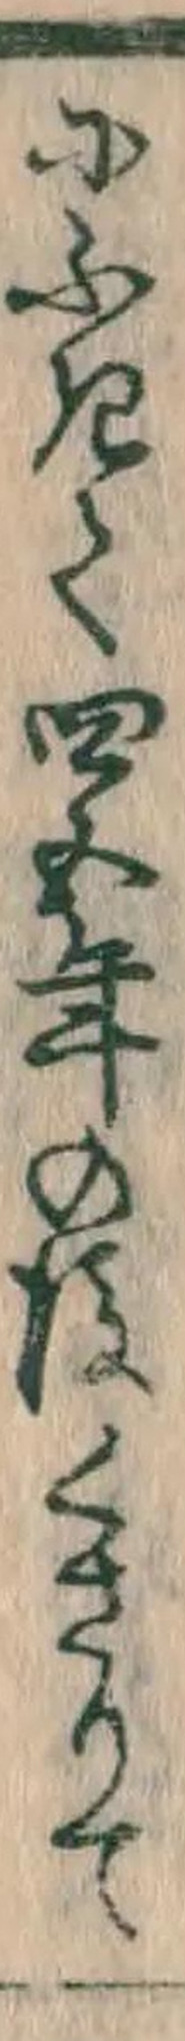にふきて四五年の後くさりて
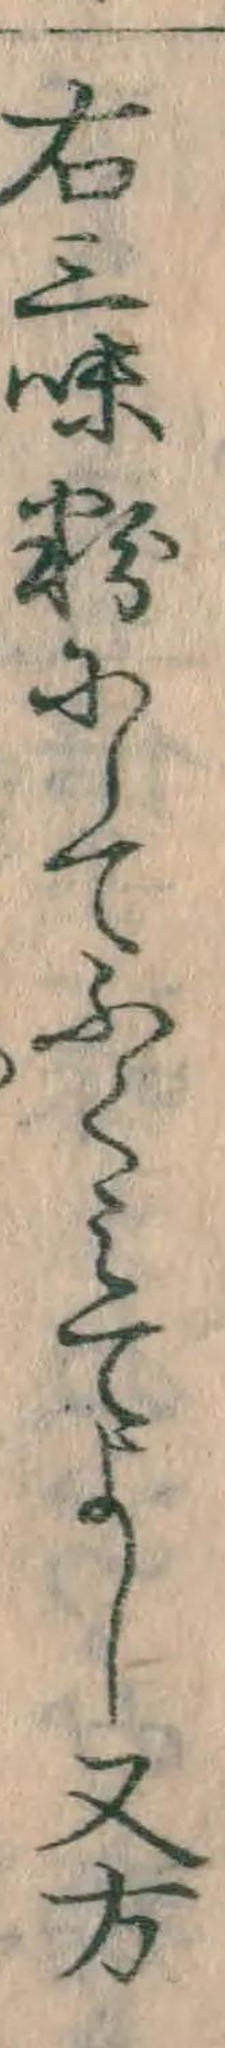右三味粉にしてふくみてよし又方
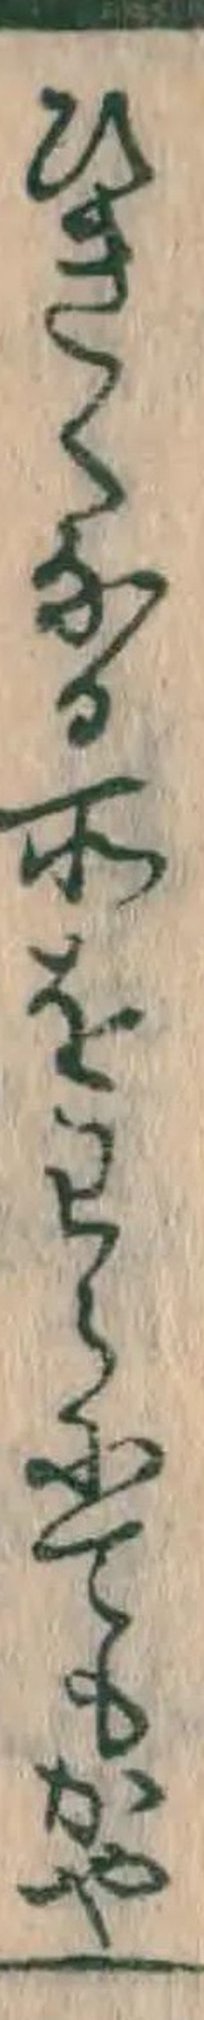ひきくなる所をわらにてもかや
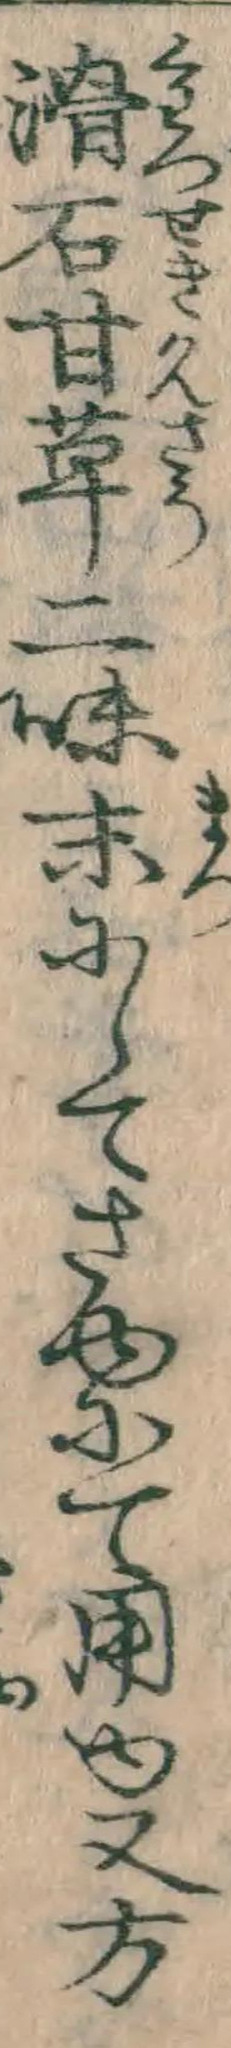滑石甘草二味末にしてさゆにて用ゆ又方
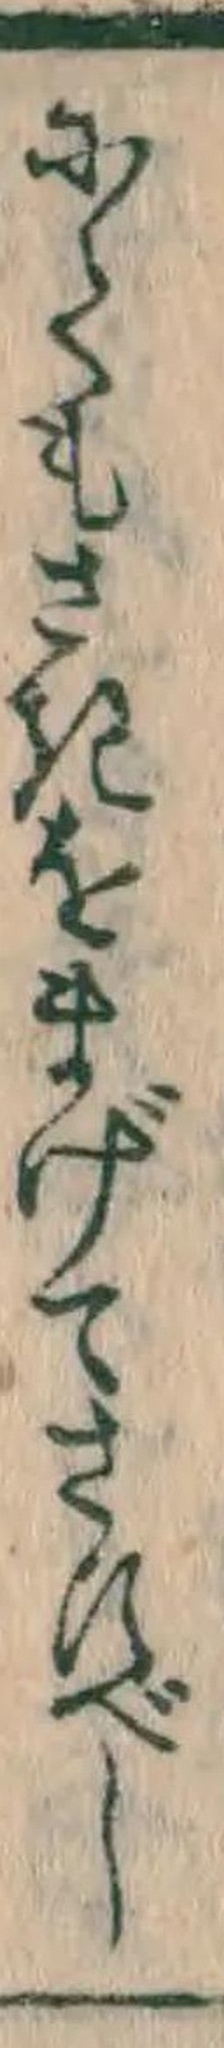にてもさきをまげてさすべし
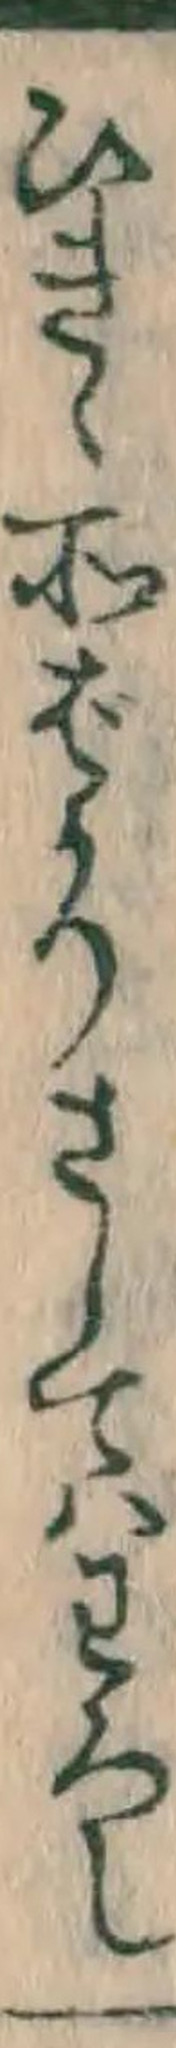ひきゝ所ばかりさしてはわろし
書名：広益秘事大全 3巻. [3]
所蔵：国立国会図書館 National Diet Library, JAPAN
